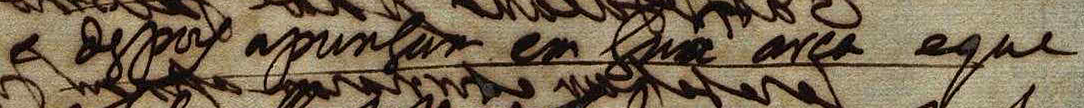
e despois a punham em huā arca e que
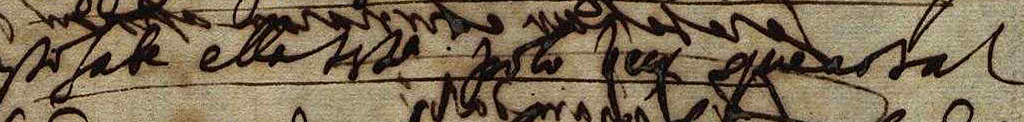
isto sabe ella testa polo veer que ao tal
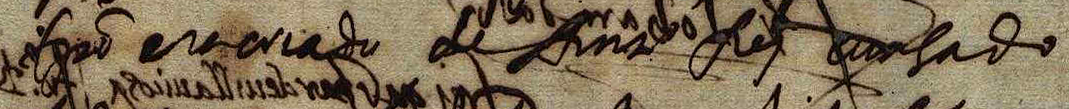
tpō era criada de Anto frez̄ cunhado
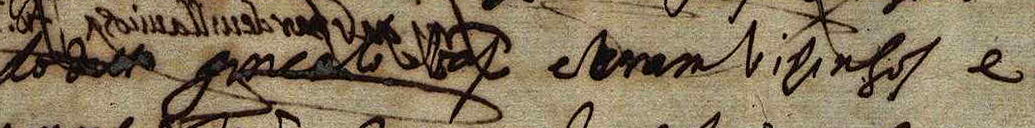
do ditto gonçalo vāz e eram vizinhos, e
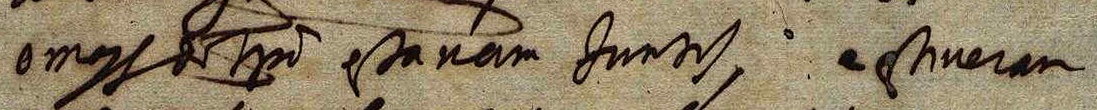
o majs do tpō estauam Juntos e estiueran
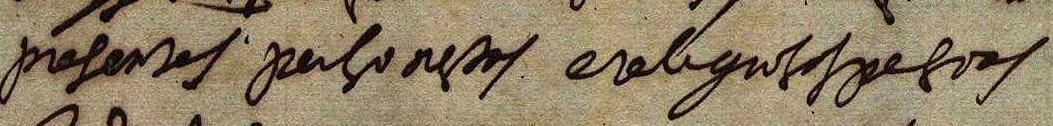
presentes por honestas e religiosas pesoas
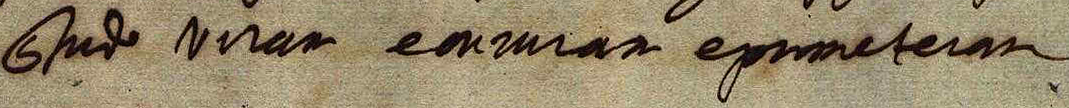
q̄ tudo viram e ouuiram e prometeram
